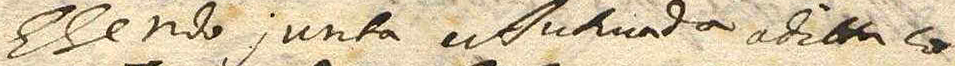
E sendo junta e Autuada a ditta co
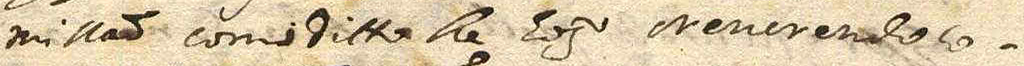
missaõ como ditto he logo o reuerendo co
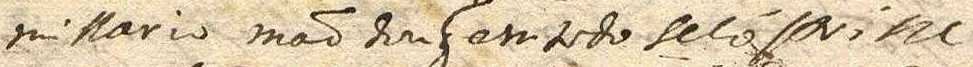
missario maõdou que em todo se cōprisse
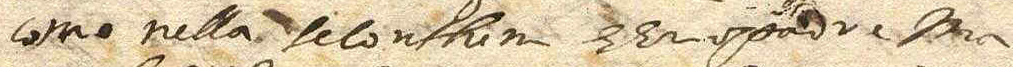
como nella se conthem E Eu o padre Ma
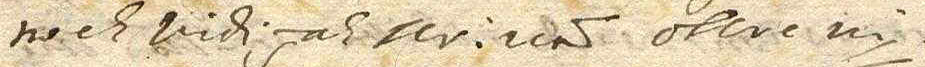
noel Vidigal scriuaõ o screui.
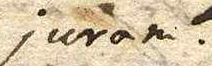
juram.to
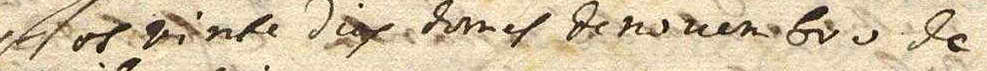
Aos vinte dias do mes de nouembro de
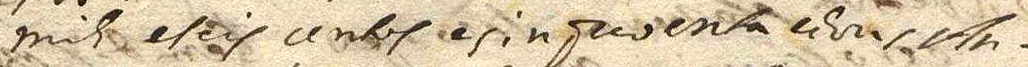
mil e seisçentos e sinquoenta e dous An
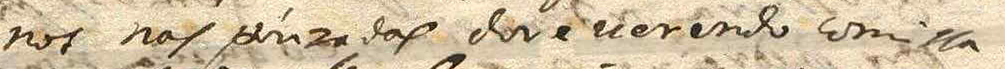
nos nas pouzadas do reuerendo comissa
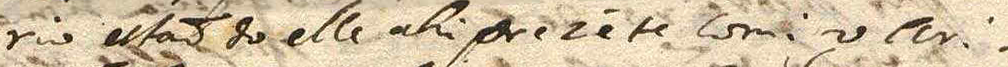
rio estaõdo elle ahi prezēte comigo scri
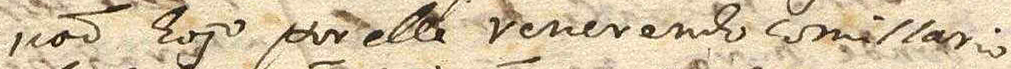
uaõ logo por elle reuerendo comissario
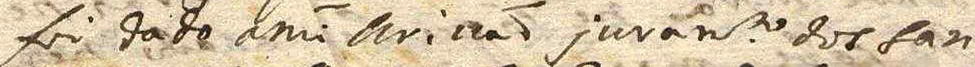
foi dado a mī scriuaõ juram.to dos san
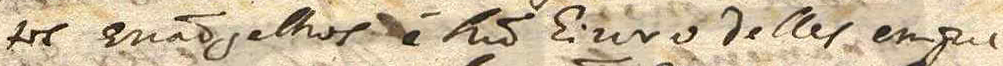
tos Euaõjelhos ē hū liuro delles em que
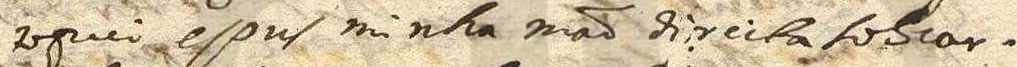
toquei e pus minha mão direita sob car
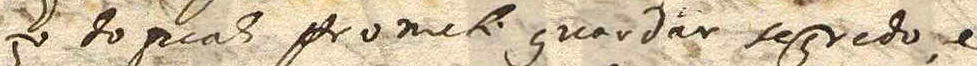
go do qual prometi guardar segredo, e
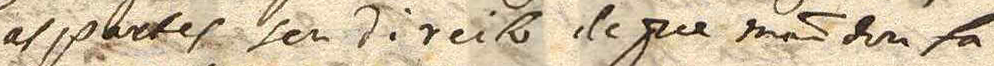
as partes seu direito de que mãodou fa
